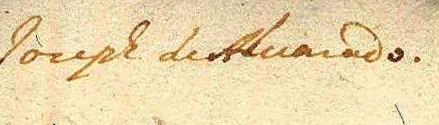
Iozeph de Aluarado.
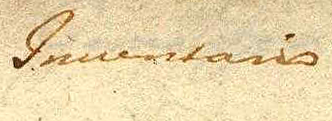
Inuentario
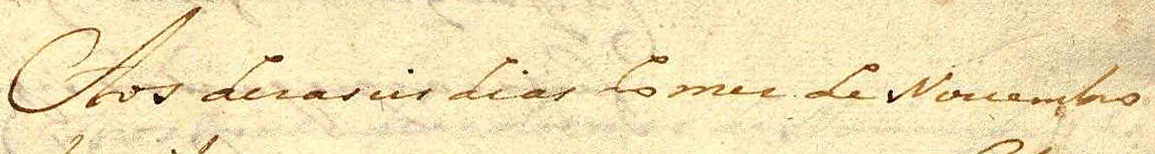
Aos dezaseis dias do mez de Nouembro
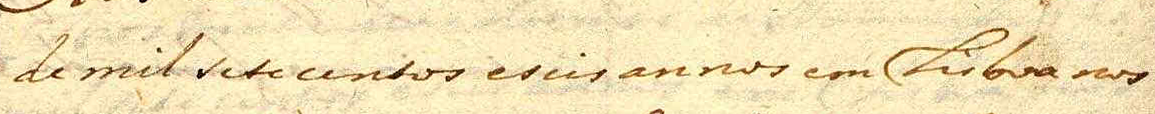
de mil setecentos e seis annos em Lisboa nos
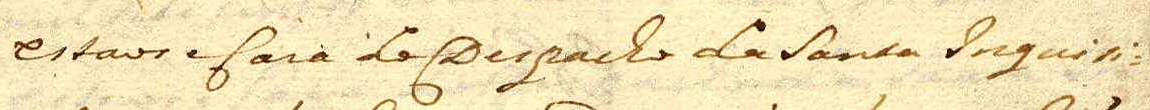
estaos e Caza do Despacho da Santa Inquisi
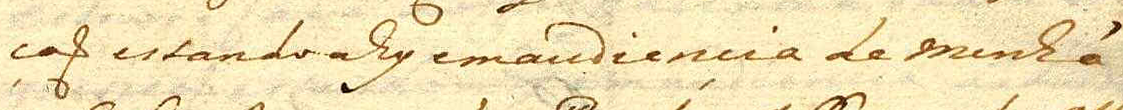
çaõ estando ahy em audiencia de menhã
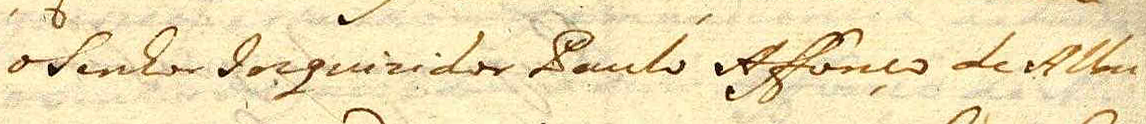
o Senhor Inquizidor Paulo Affonço de Albu
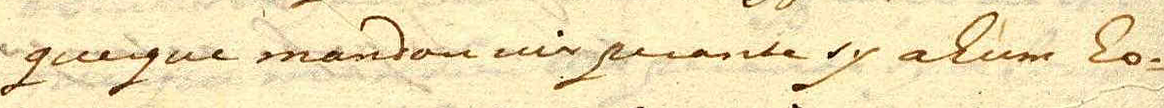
querque mandou uir perante sy a hum ho
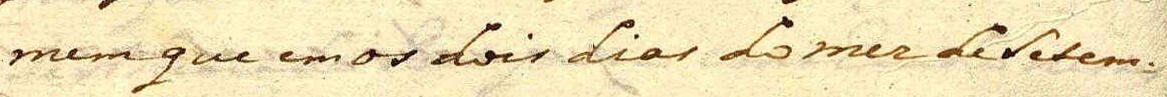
mem que em os dois dias do mez de setem
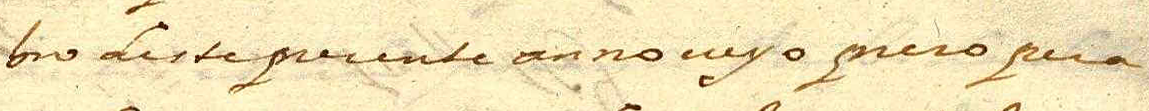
bro deste prezente anno ueyo prezo pera
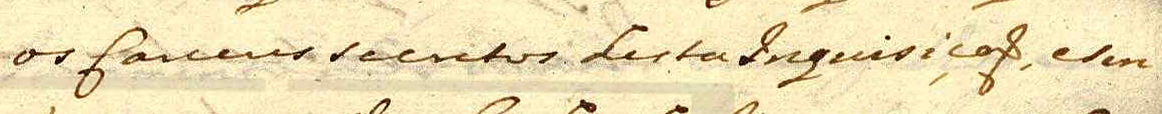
os Carceres secretos desta Inquisiçaõ, e sen
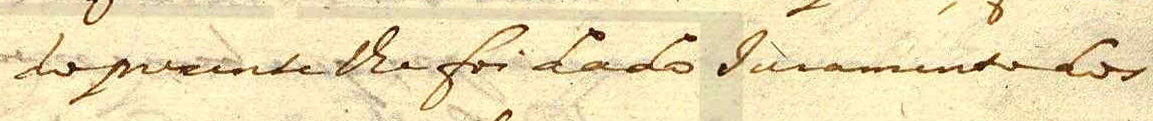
do prezente lhe foi dado Iuramento dos
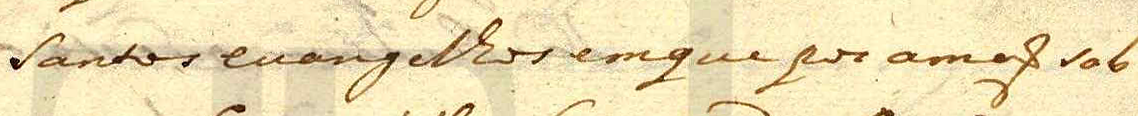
santos euangelhos em que pos a maõ sob
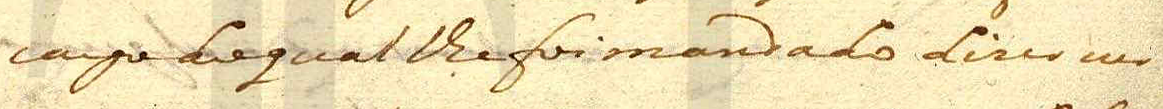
cargo do qual lhe foi mandado dizer uer
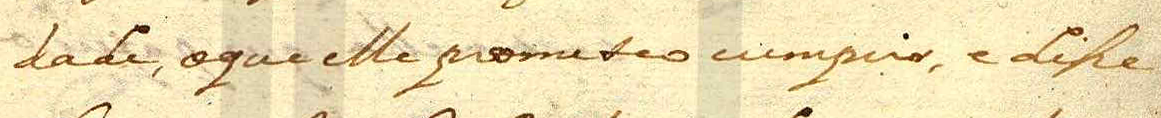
dade, o que elle prometeo cumprir, e disse
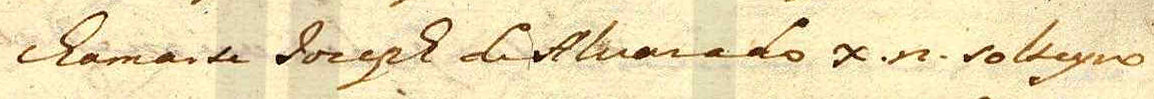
chamarse Iozeph de Aluarado x. n. solteyro
